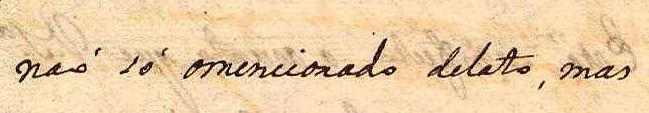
naõ só o mencionado delato, mas
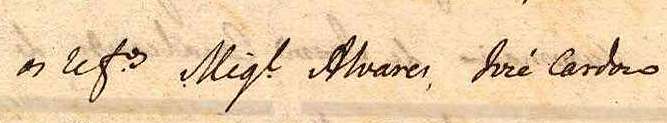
os Ref.os Mig.l Alvares, Iozé Cardozo
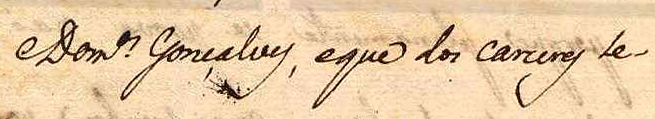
e Dom.os Gonçalves, e que dos carceres se
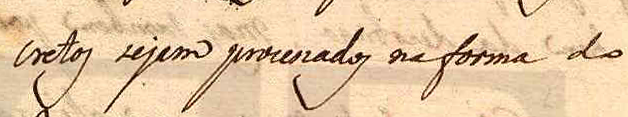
cretos sejam processados na forma do
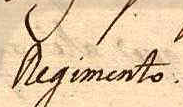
Regimento.
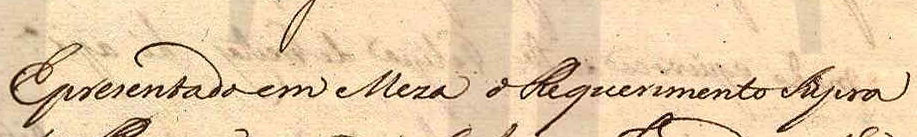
E presentado em Meza o Requerimento Supra
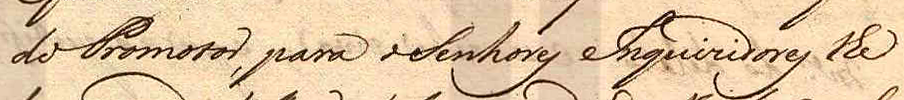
do Promotor, para o Senhores Inquizidores lhe
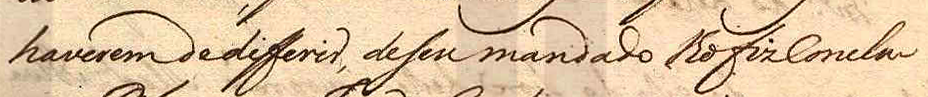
haverem de differir, de seu mandado lho fiz Conclu
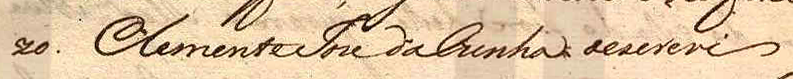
zo. Clemente Ioze da Cunha o escrevi
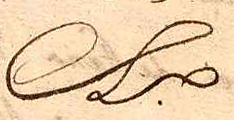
CL.o
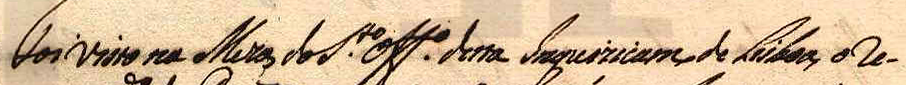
Foi visto na Meza do S.to off.o desta Inquiziçam de Lisboa, o Re
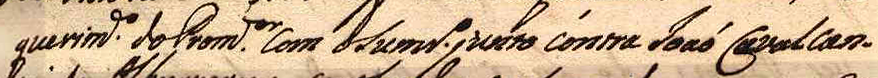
querim.to do Prom.or com o Sumr.o junto contra Ioaõ Cavalcan
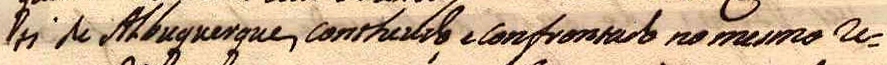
ti de Albuquerque, contheudo, e confrontado no mesmo Re
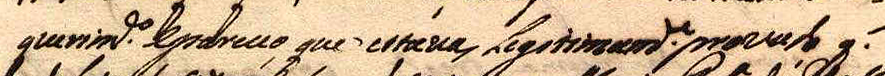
querim.to e pareceo que estaua Legitimam.te provado q̄.
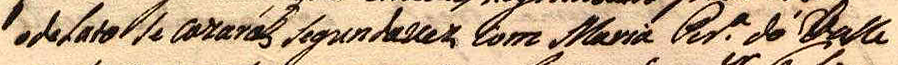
o delato se cazaraõ segunda vez com Maria Per.a do Valle
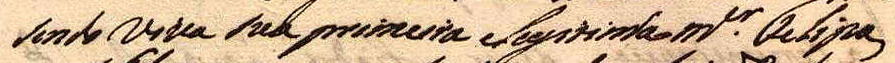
sendo viua sua primeira e legitima m.er Felipa
